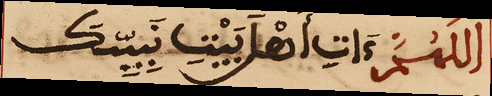اللهم ءات أهل بيت نبيك
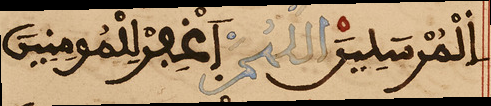المرسلين اللهم اغفر للمومنين
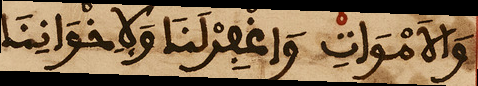والاموات واغفر لنا ولإخواننا
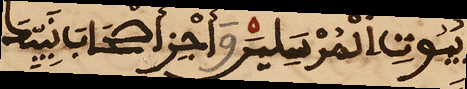بيوت المرسلين وأجز أصحاب نبيك
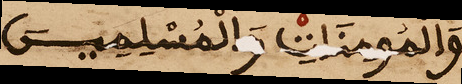والمومنات والمسلمين
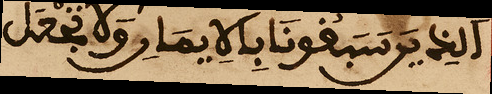الذين سبقونا بالايمان ولا تجعل
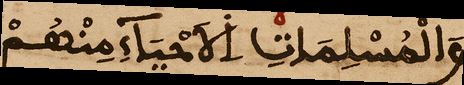والمسلمات الاحيآء منهم
